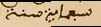سبعماية سنة
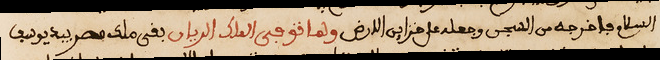السلام فاخرجه من السجن وجعله على خزائن الارض ولما توفى الملك الديان بقى ملك مصر يبد يوسف
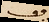قف
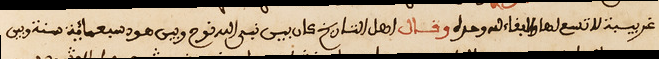غربيبة لا تسع لها والبقاء لله وحده وقال اهل التاريخ كان بين بنى الله نوح وبين هود سبعمائة سنة وبين
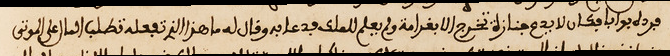فرده بوابا فكان لا يدع جنازة تخرج الا بغرامة ولم يعلم للملك قد عابه وقال له ما هذا الذي تفعله تطلب المال على الموتى
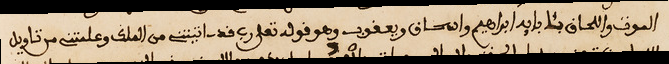الموت واللحاق بئابائه ابراهيم واسحاق ويعقوب وهو قوله تعلى رب قد اتينتى من الملك علمتنى من تاويل
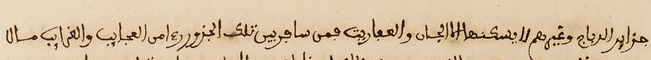جزائر الرباج وغيرهم يسكنها الا الجان والعفاريب فمن سافربين تلك الجزور رءا من العجائب الغرائب مال
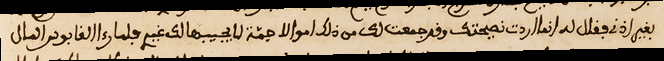بغير اذنى فقال له انما اردت نصيحتك وقد جمعت لك من ذلك امو الاجمة لما يجيبها لك غيرى فلما رءا القابوس المال
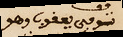توثى يعقوب وهر
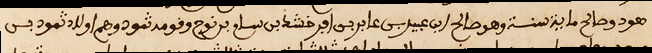هود وصالح ماية سنة وهو صالح ابن عبيد بن هابد بن افرخشد بن سام بن نوح وقومه ثمودوهم اولاد ثمود بن
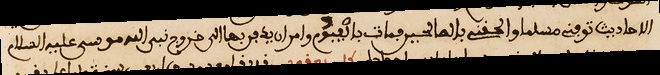الاحاديث توفنى مسلما والحقنى بالصالحين فمات بالفيوم وامر ان بدفن بها الى خروج نبى الله موسى عليه السلام
